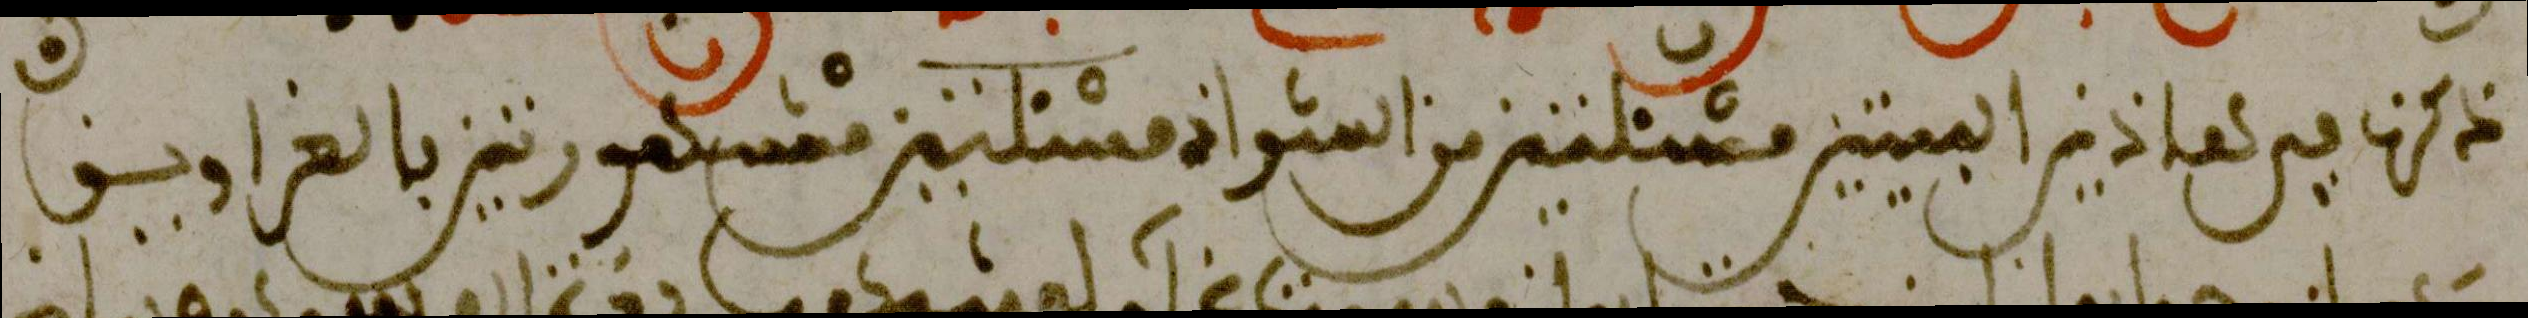ذكرن في هاذين البيتين مسْئلتين من الشواذ مسْئلتين مشْهورتين بالغراوين
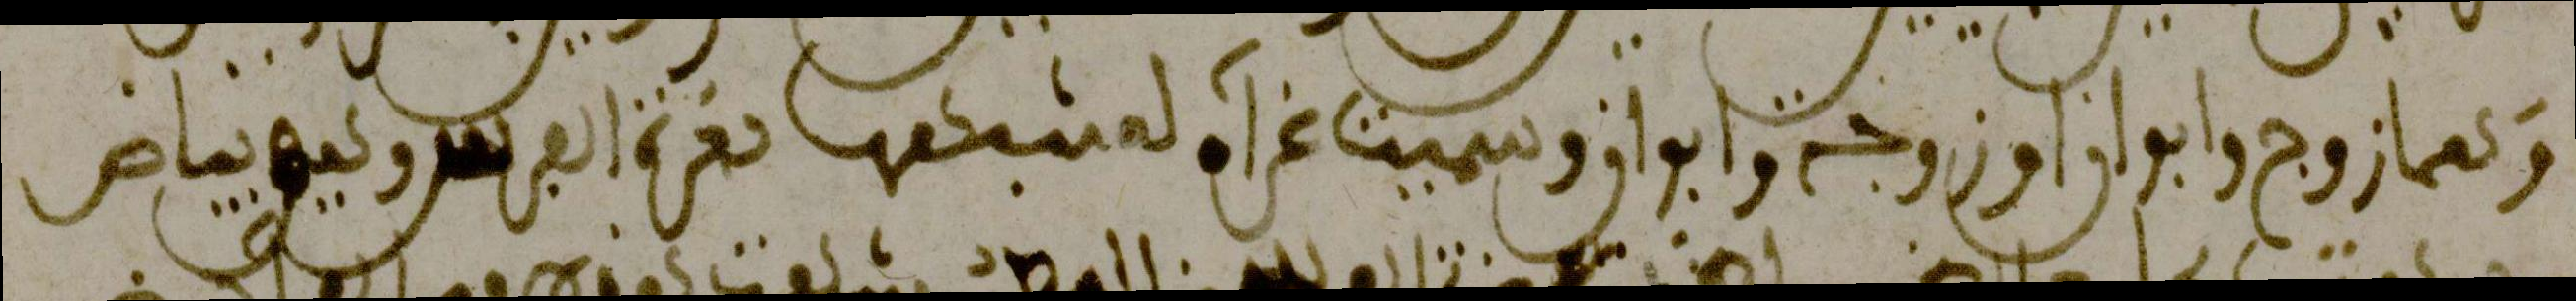وهما زوج وابوان او زوجة وابوان وسميت غراء لشبهها بغرة الفرس وهو بياض
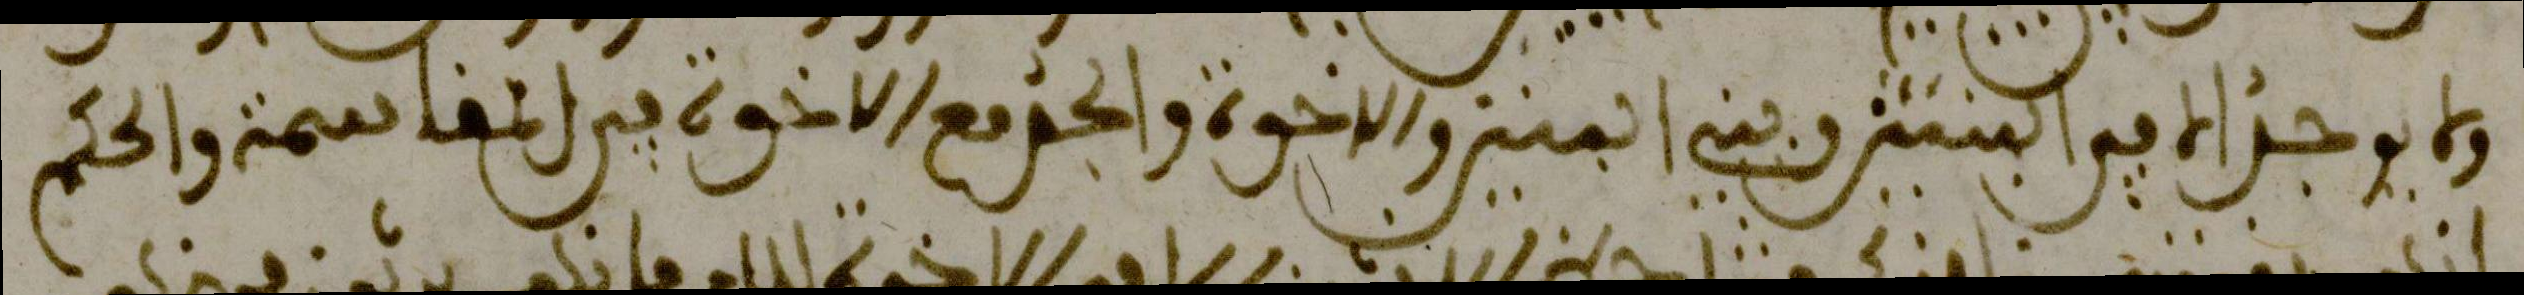ولا يوجد الا في البنين وبني البنين والاخوة والجد مع الاخوة في المقاسمة والحكم
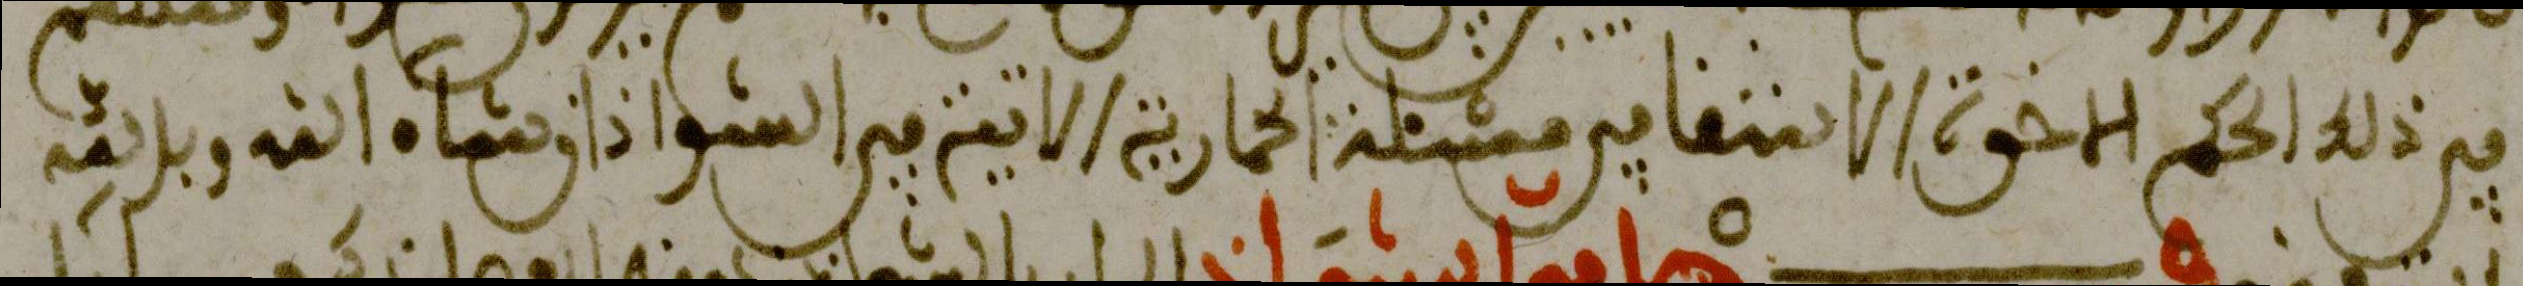في ذلك الحكم الاخوة الاشقا في مسْئلة الحمارية الاتية في الشواذ ان شاء الله وبالله
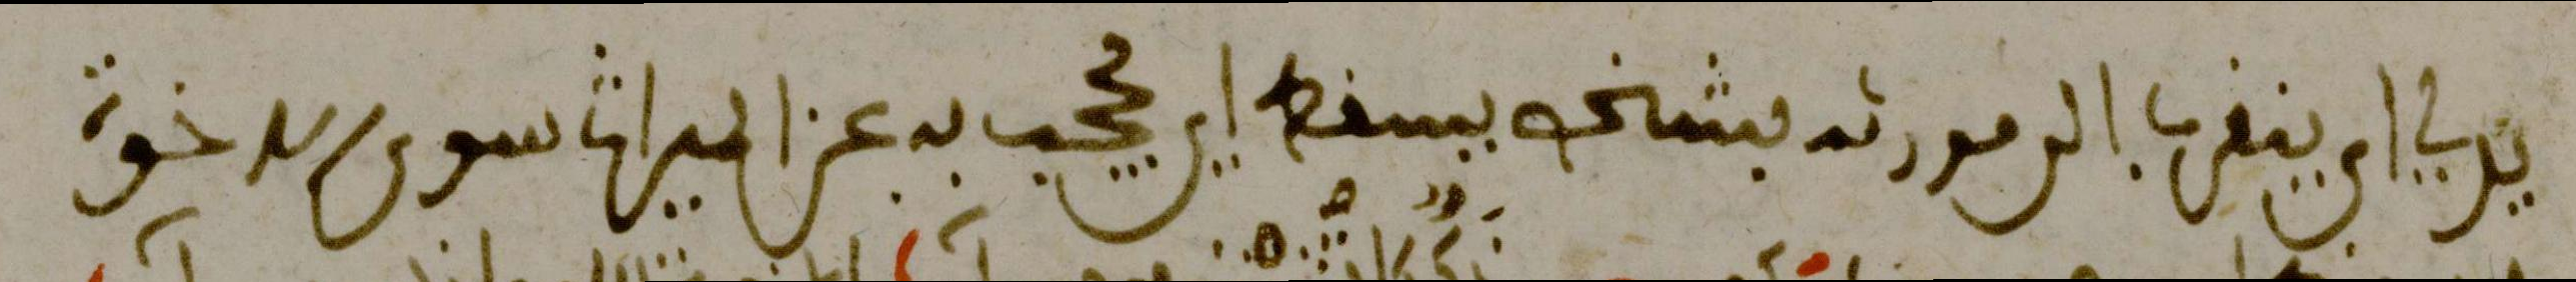يدي اي يتقرب الى موروثه بشخص يسقط اي يحجب به عن الميراث سوى الاخوة
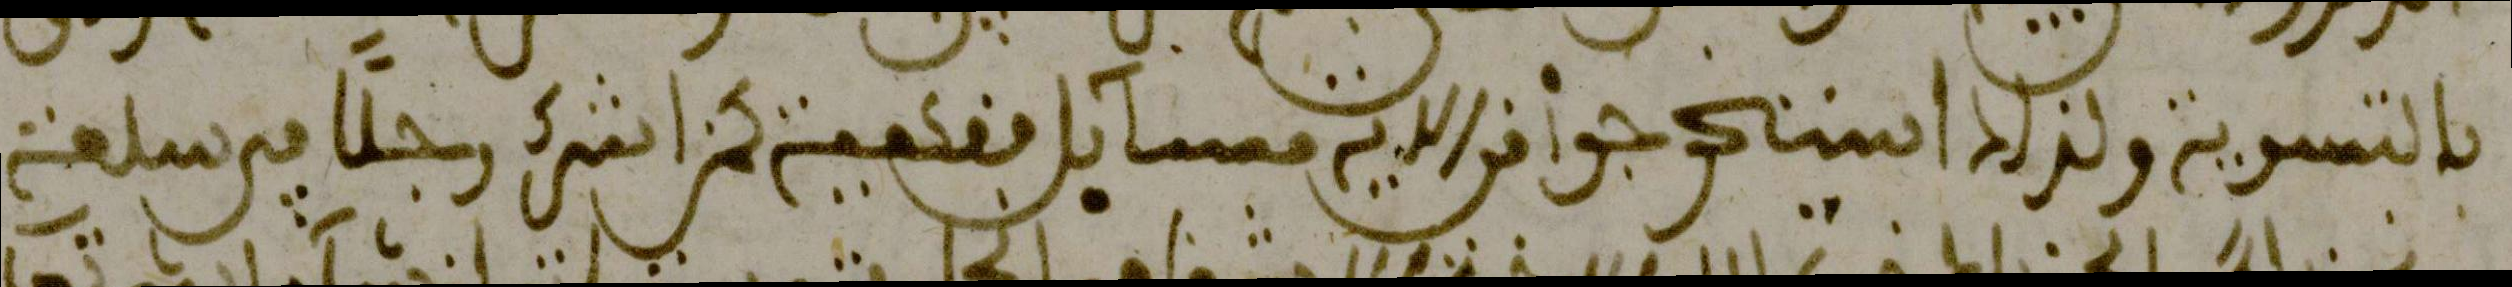بالتسوية ولذلك استخرجوا من الاية مسائل فقهية كمن اشرك رجلًا في سلعة
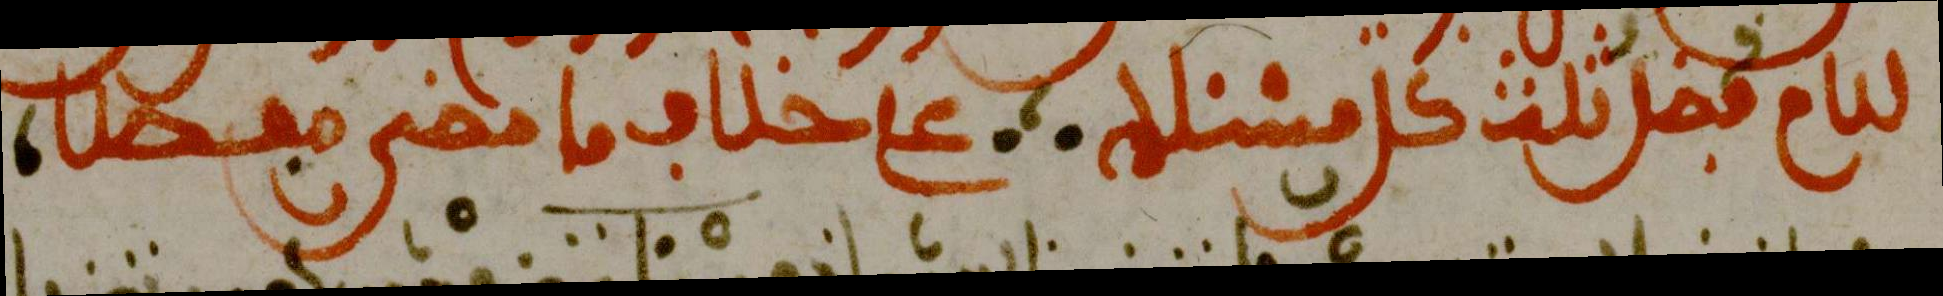للام فصل ثلث كل مسْئله على خلاف ما مضى مفصلا
